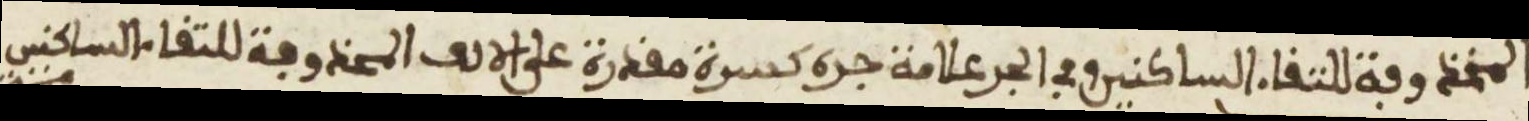المحذوفة للتقاء الساكنين و في الجر علامة جره كسرة مقدرة على الالف المحذوفة للتقاء الساكنين
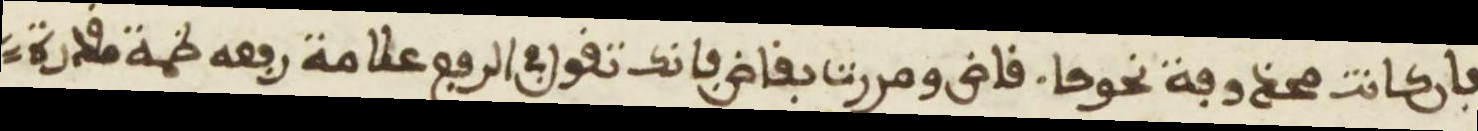فان كانت محذوفة نحو حاء قاض و مررت بقاض فانك تقول في الرفع علامة رفعه ظمة مقدرة
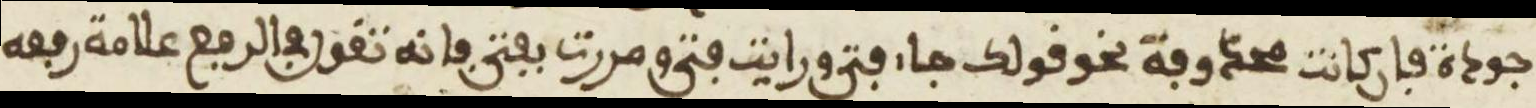جودة فان كانت محذوفة نحو قولك جاء فتى و رايت فتى و مررت بفتى فانه تقول في الرفع علامة رفعه
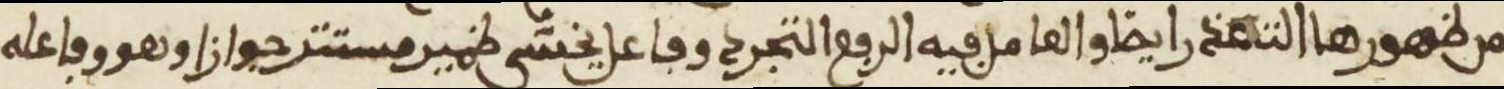من ظهورها التعذر ايضا و العامل فيه الرفع التجرد و فاعل يخضى ظمير مستتر جوازا و هو و فاعله
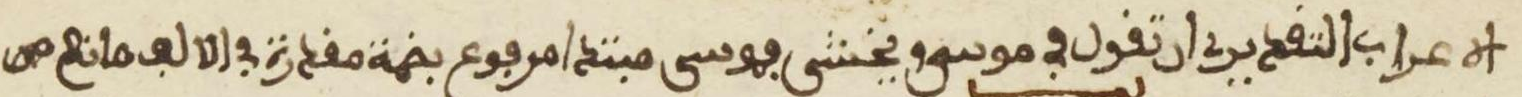الاعراب التقديري ان تقول في موسى و يخشى فموسى مبتدا مرفوع بضمة في الالف مانع
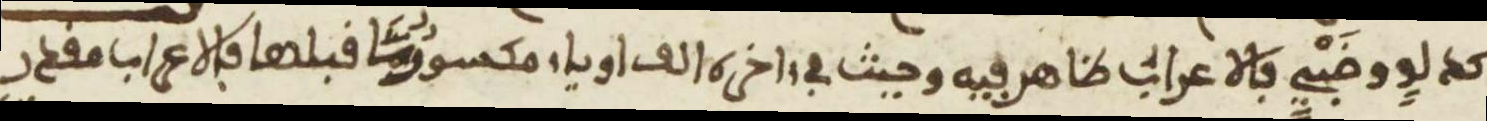كدلو و ضبي فالاعراب ظاهر فيه و حيث في آخره الف او ياء مكسور ما قبلهما فالاعراب مقدر
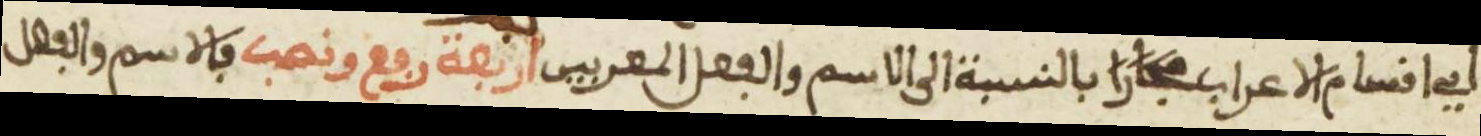اي اقسام الاعراب بالنسبة الى الاسم و الفل المعربين اربعة رفع و نصب فالاسم و الفعل
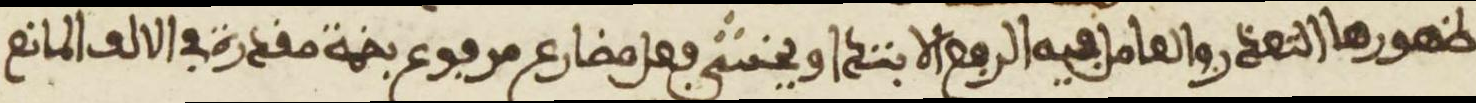ظهورها التعذر و العامل فيه الرفع الابتدا و يخشى فعل مضارع مرفوع بضمة مقدرة في الالف المانع
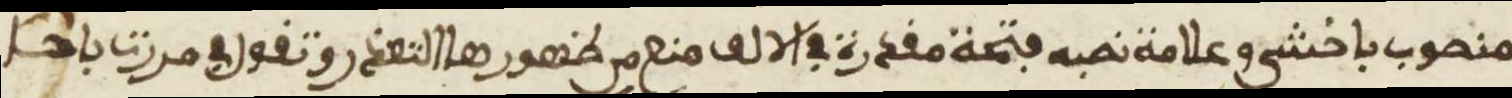منصوب باخشى و علامة نصبه فتحة مقدرة في الالف منع من ظهورها التعذرو تقول في مررت با #
